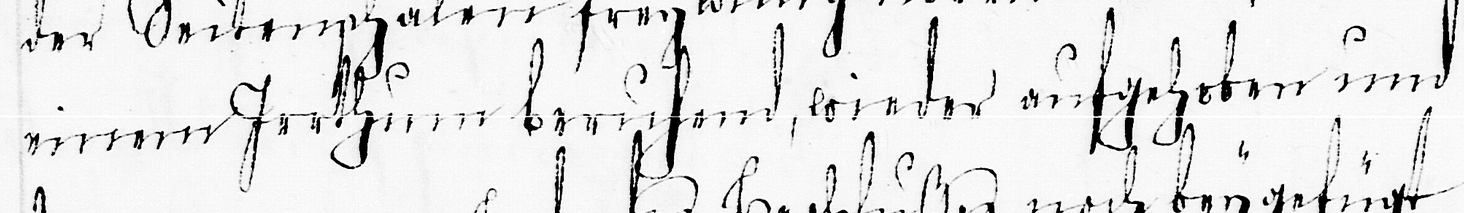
einem Irrthum beruhend, wieder aufgehoben und
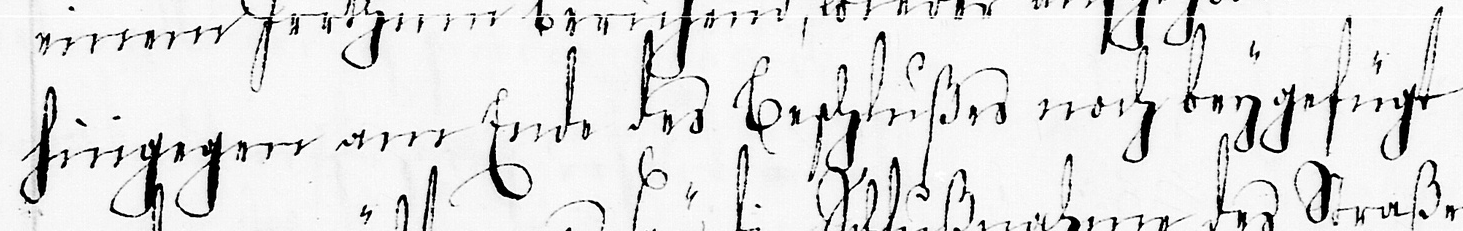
hingegen am Ende des Beschlußes noch beygefügt
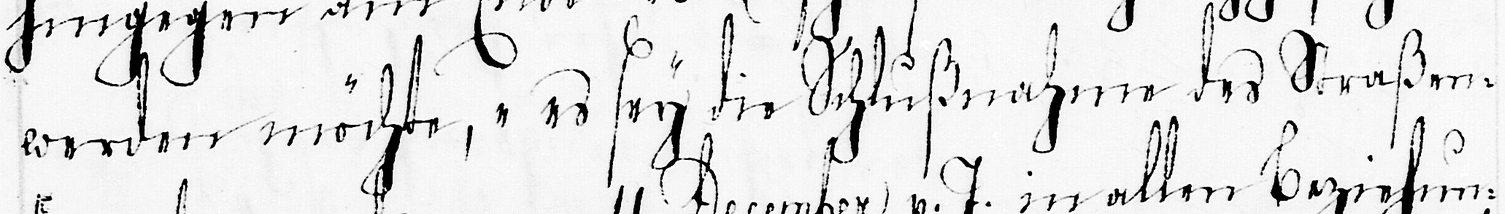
werden möchte, „es sey die Schlußnahme des Straßen¬
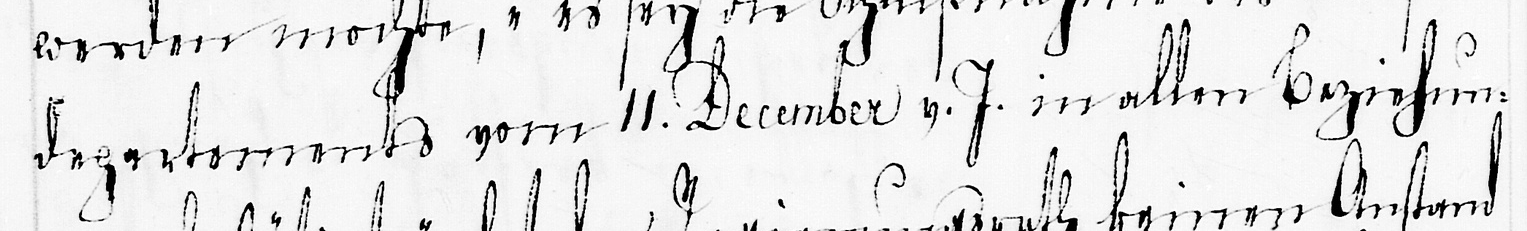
departements vom 11. December v. J. in allen Beziehun¬
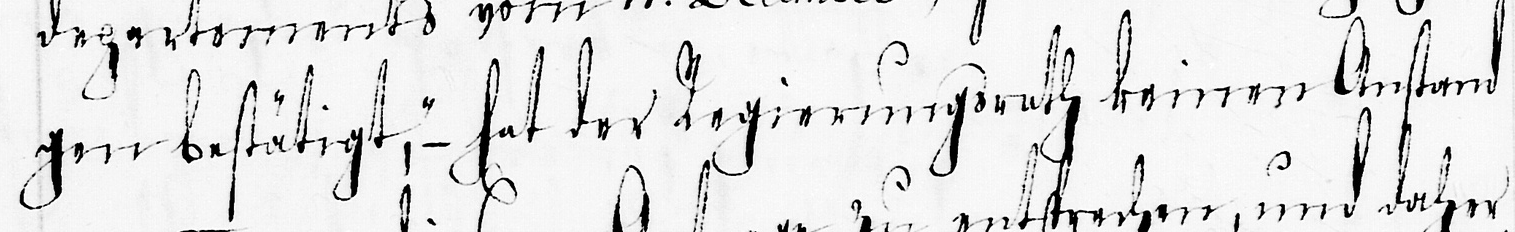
gen bestätigt,“ – hat der Regierungsrath keinen Anstand
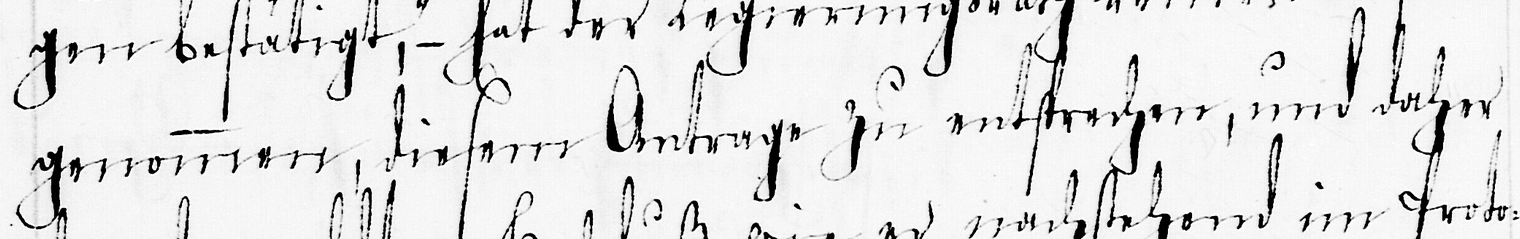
genommen, diesem Antrage zu entsprechen, und daher
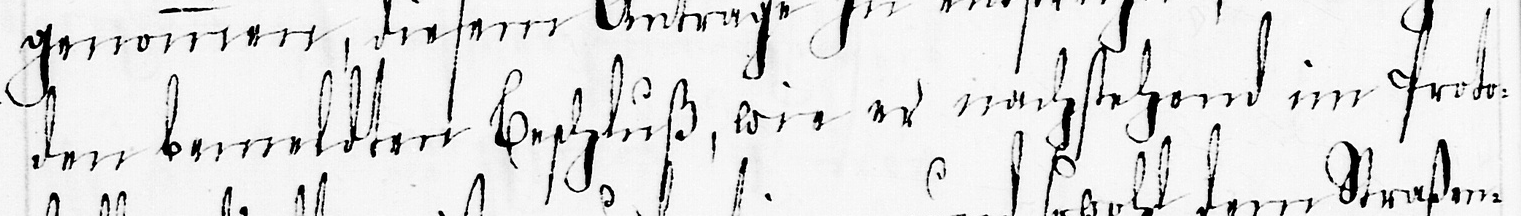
den bemeldten Beschluß, wie er nachstehend im Proto¬
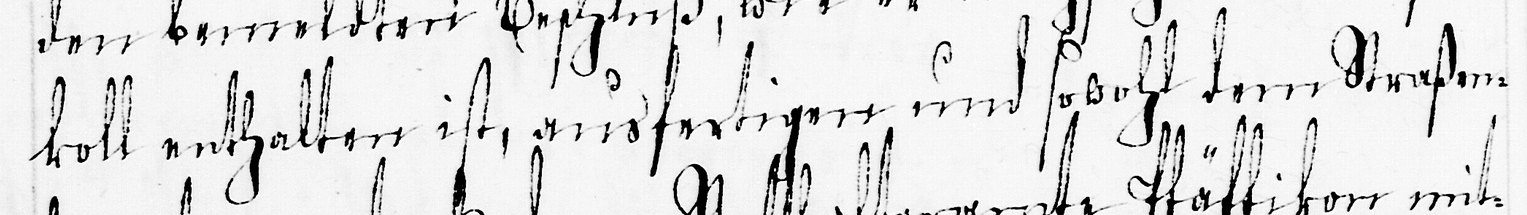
koll enthalten ist, ausfertigen und sowohl dem Straßen¬
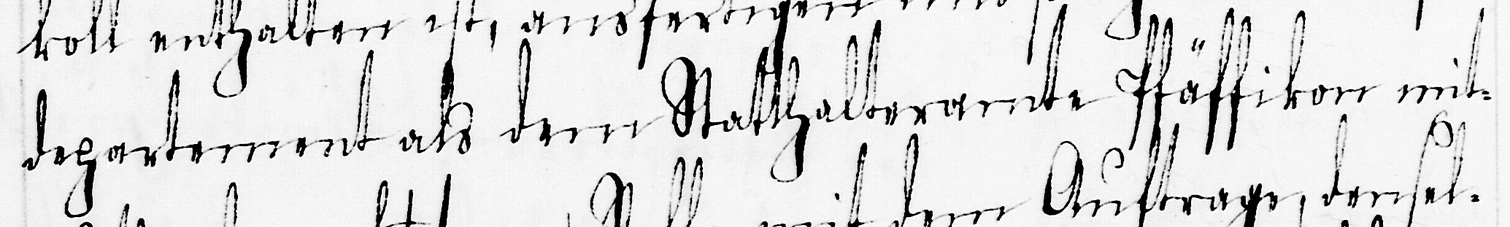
departement als dem Statthalteramte Pfäffikon mit¬
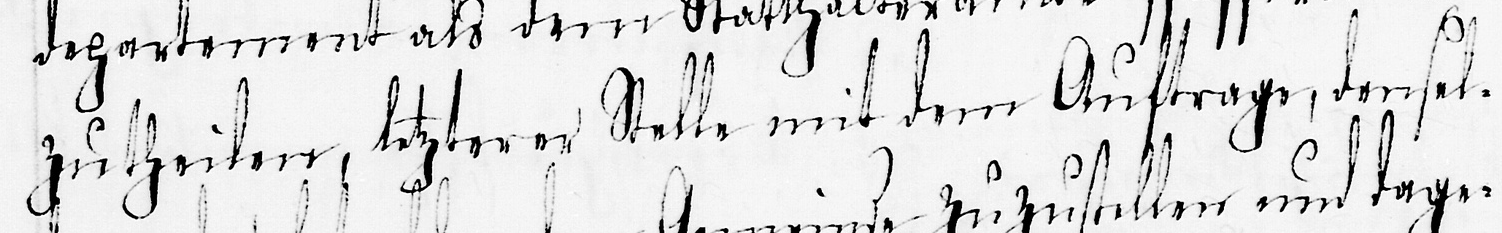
zutheilen, letzterer Stelle mit dem Auftrage, densel¬
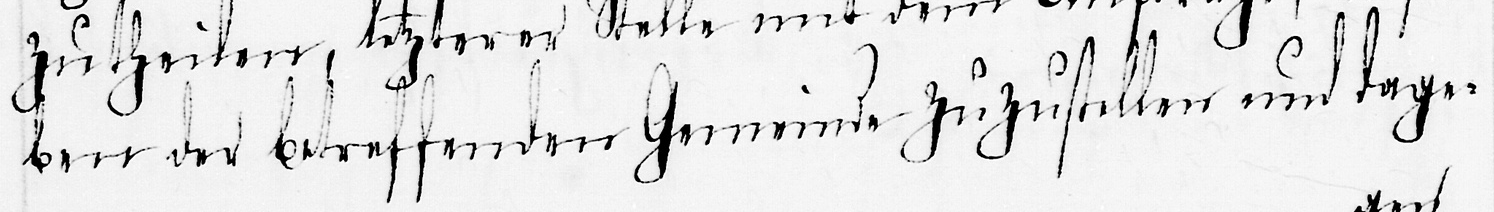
ben der betreffenden Gemeinde zuzustellen und dage-
